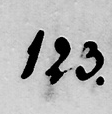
83.
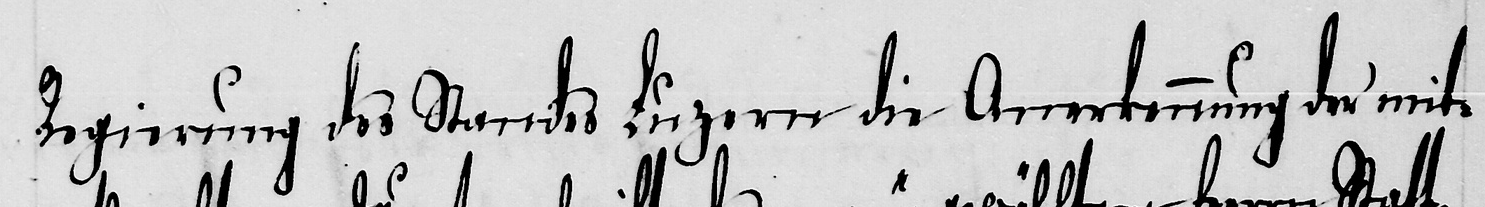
Regierung des Standes Luzern die Anerkennung der mit¬
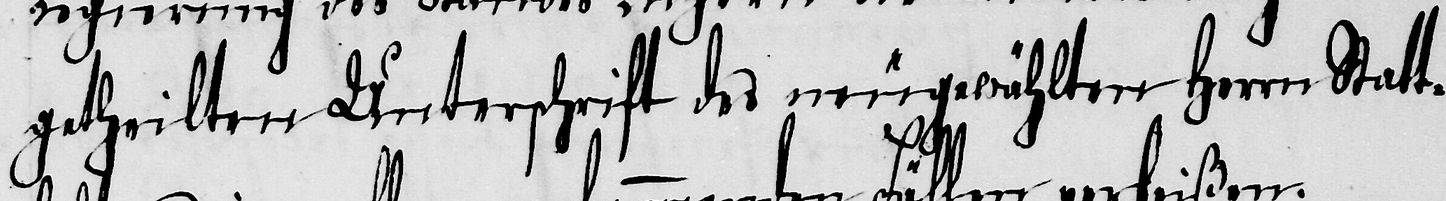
getheilten Unterschrift des neugewählten Herrn Stat¬
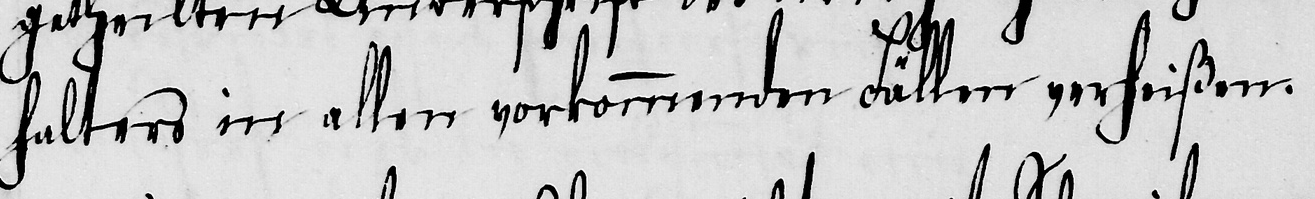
thalters in allen vorkommenden Fällen verheißen.
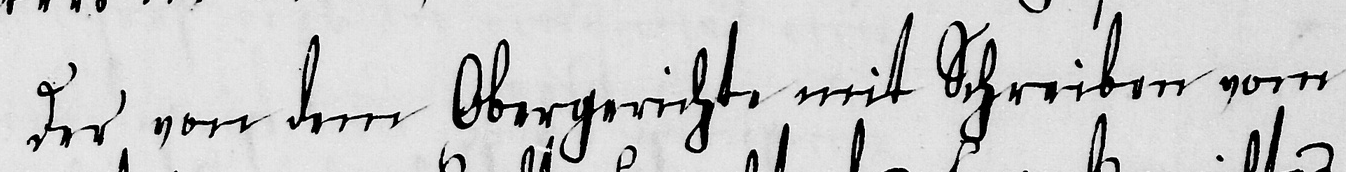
Der von dem Obergerichte mit Schreiben vom
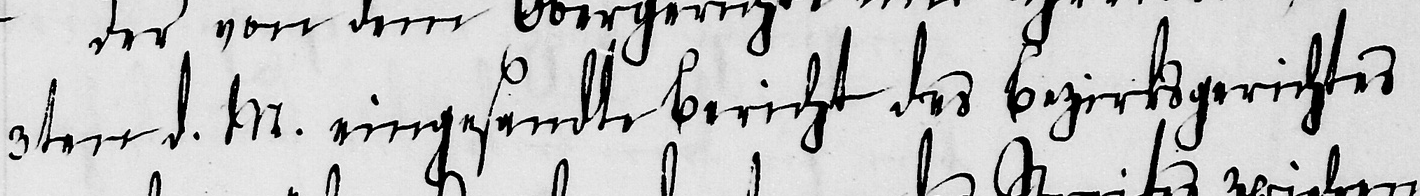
3ten d. M. eingesandte Bericht des Bezirksgerichtes
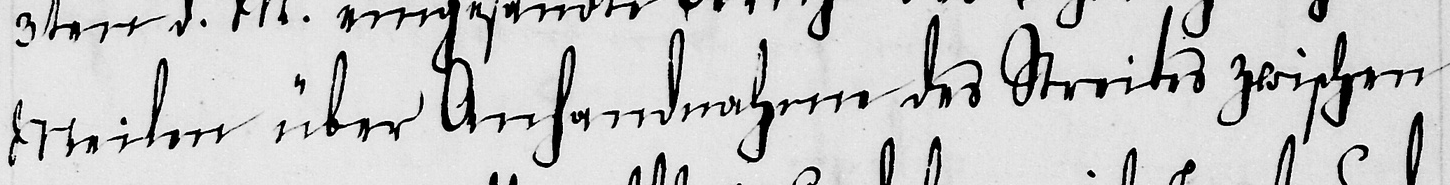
Meilen über Anhandnahme des Streites zwischen
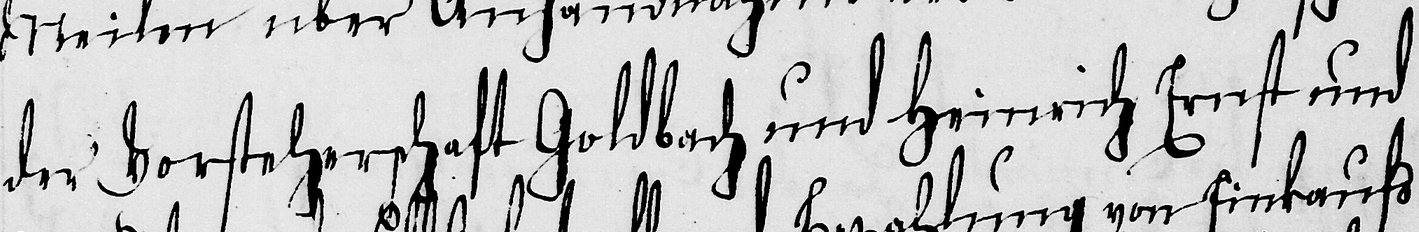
der Vorsteherschaft Goldbach und Heinrich Ernst und
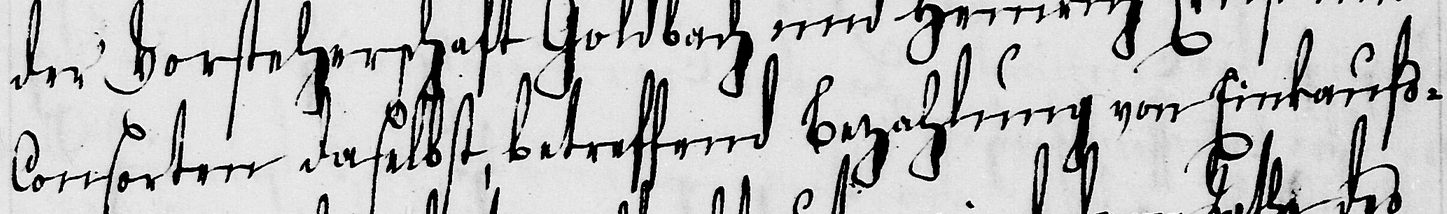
Consorten daselbst, betreffend Bezahlung von Einkaufs¬
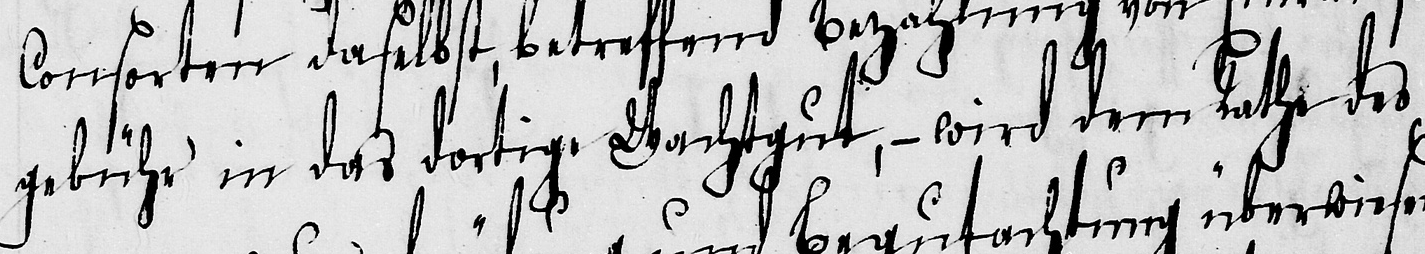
gebühr in das dortige Wachtgut, – wird dem Rathe des
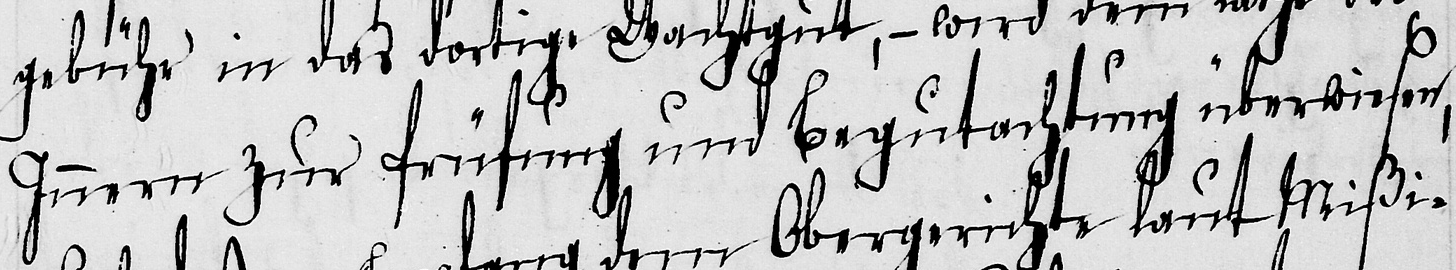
Innern zur Prüfung und Begutachtung überwiesen,
